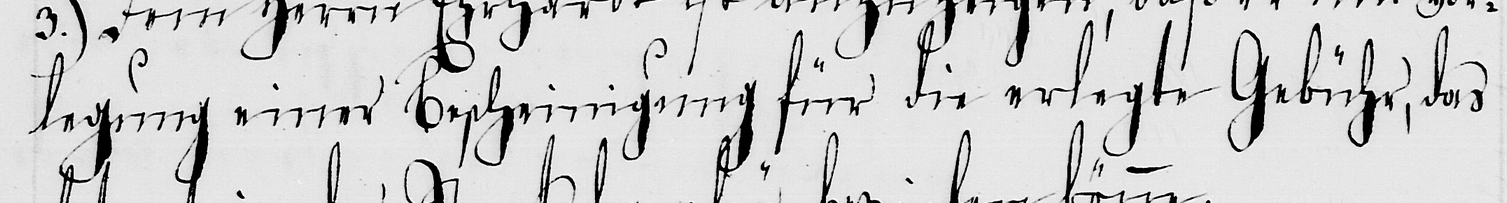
legung einer Bescheinigung für die erlegte Gebühr, das
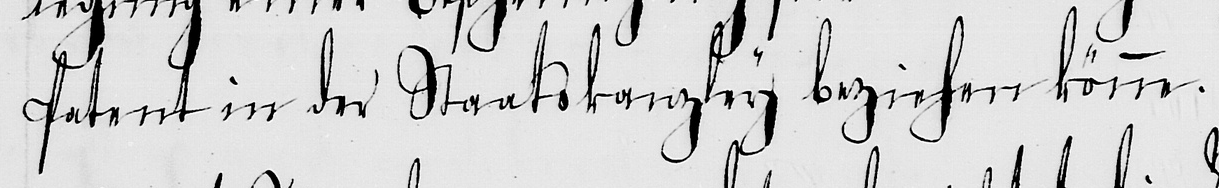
Patent in der Staatskanzley beziehen könne.
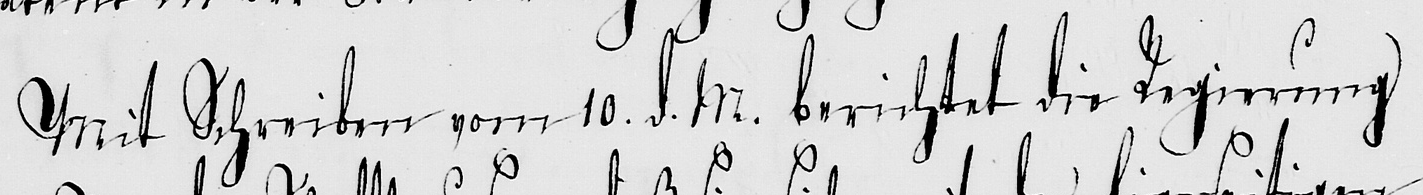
Mit Schreiben vom 10. d. M. berichtet die Regierung
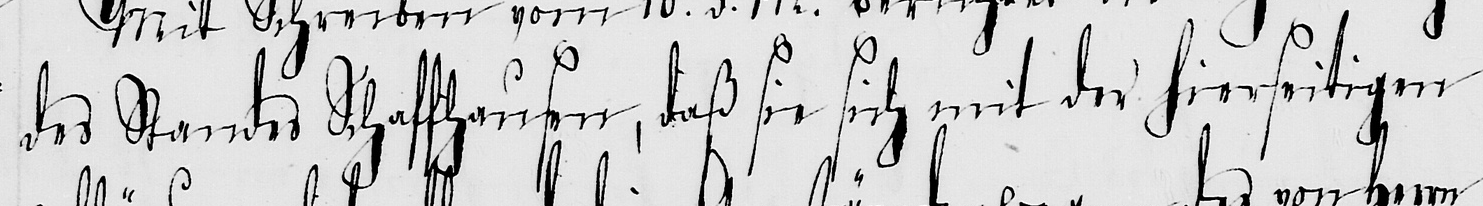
des Standes Schaffhausen, daß sie sich mit der hierseitigen
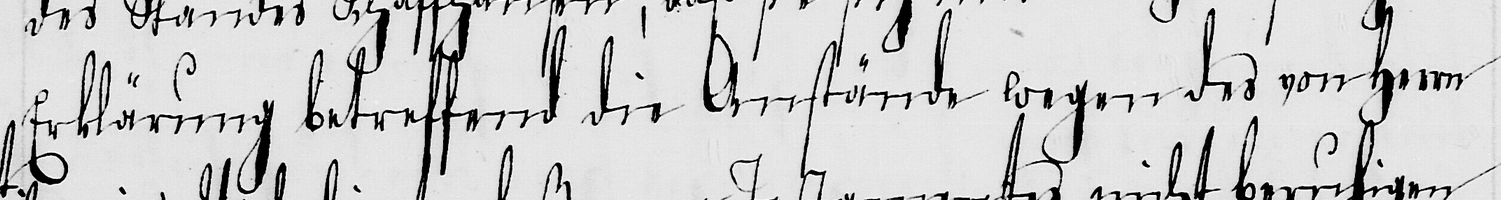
Erklärung betreffend die Anstände wegen des von Herrn
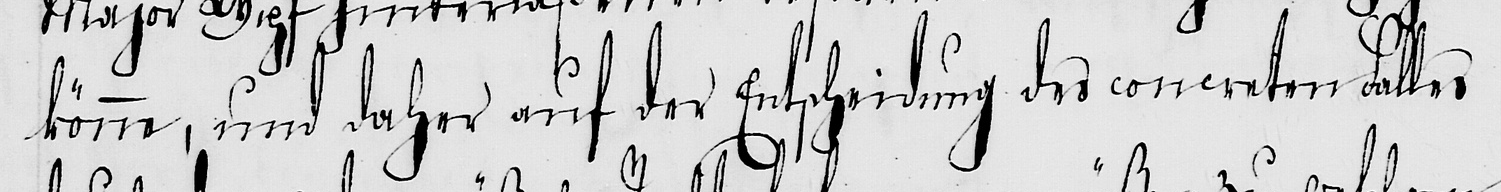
könne, und daher auf der Entscheidung des concreten
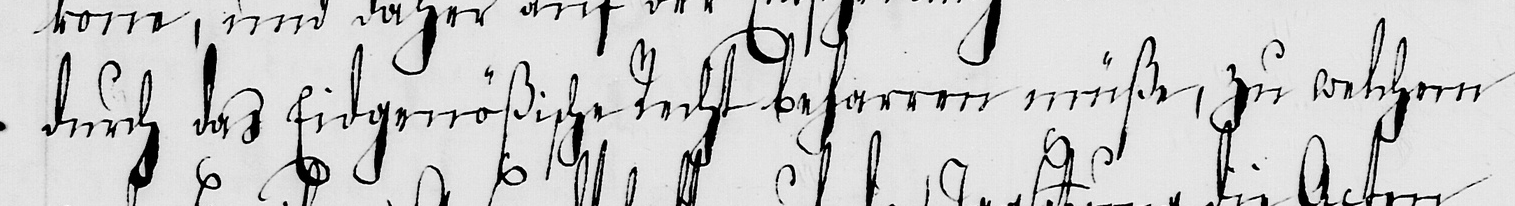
durch das Eidgenößische Recht beharren müße, zu welchem
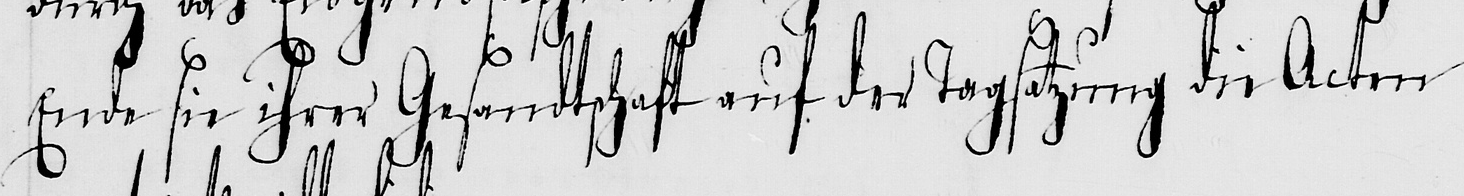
Ende sie ihrer Gesandtschaft auf der Tagsatzung die Acten
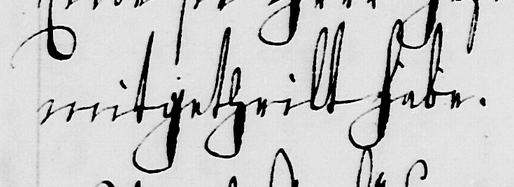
mitgetheilt habe.
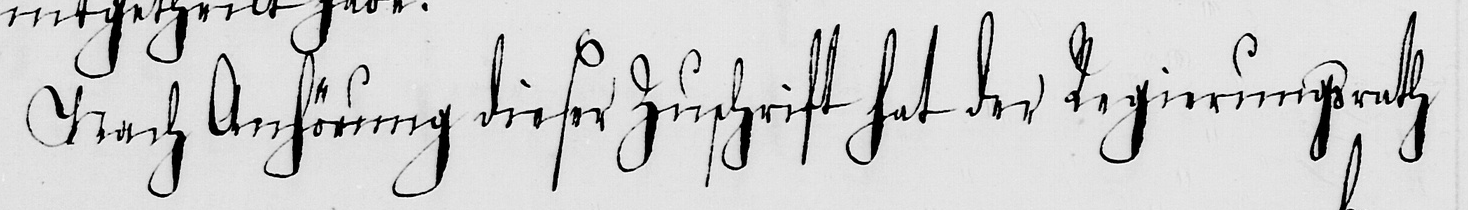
Nach Anhörung dieser Zuschrift hat der Regierungsrath
